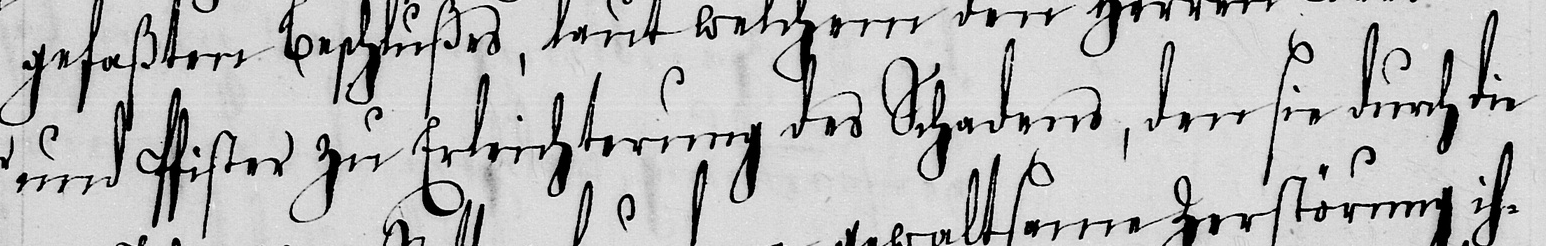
und Pfister zu Erleichterung des Schadens, den sie durch d¬
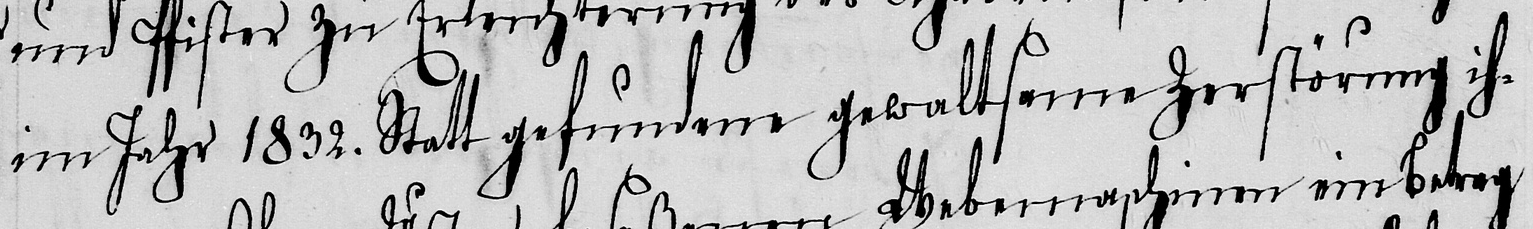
im Jahr 1832. Statt gefundene gewaltsame Zerstörung ih¬
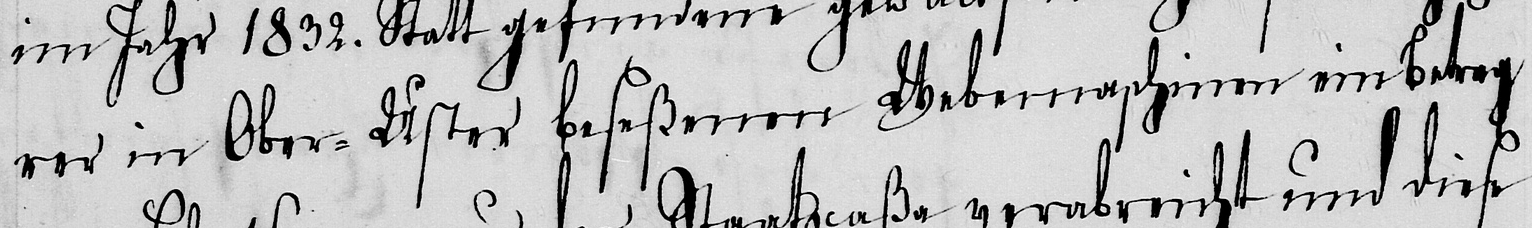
rer in Ober-Uster beseßenen Webmaschinen ein Betrag
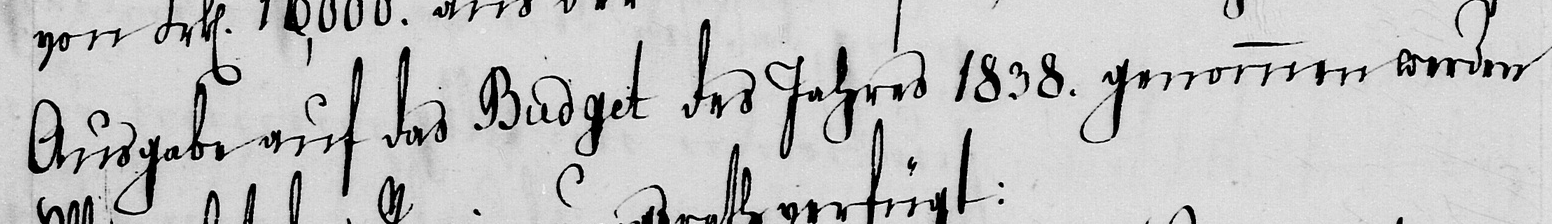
Ausgabe auf das Budget des Jahres 1838. genommen werden
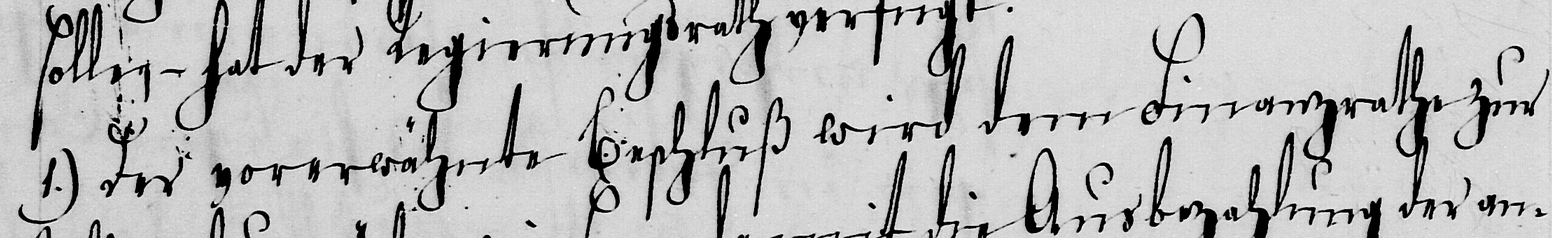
1.) Der vorerwähnte Beschluß wird dem Finanzrathe zur
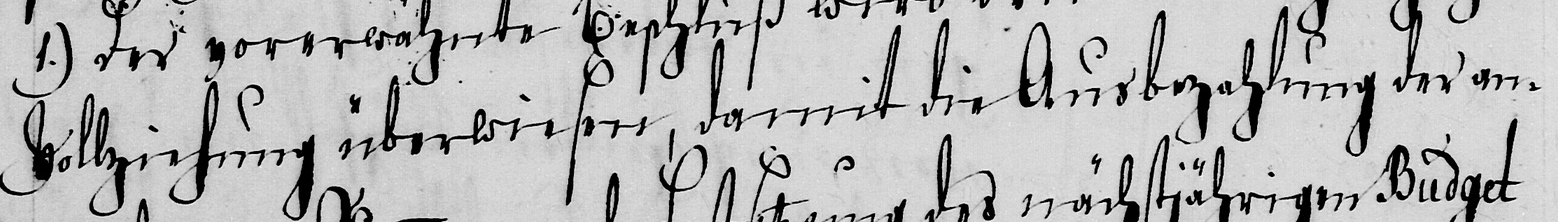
Vollziehung überwiesen, damit die Ausbezahlung der an¬
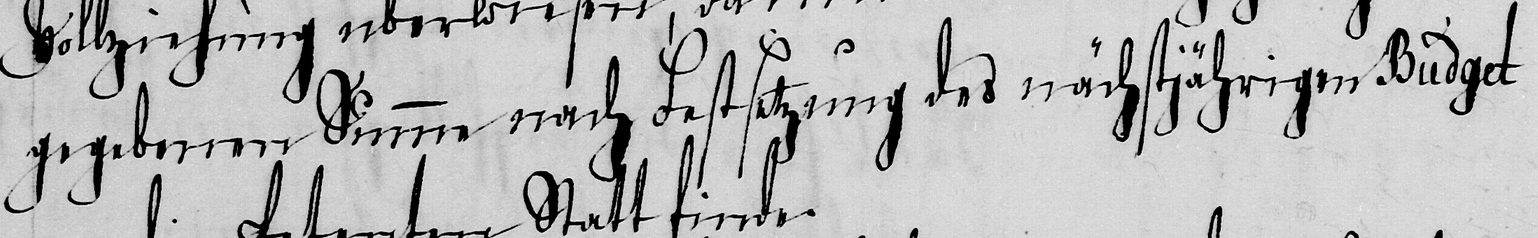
gegebenen Summe nach Festsetzung des nächstjährigen Budget
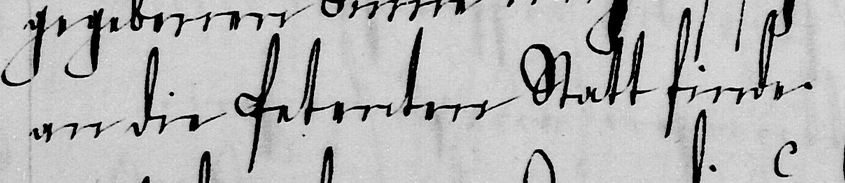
an die Petenten Statt finde.
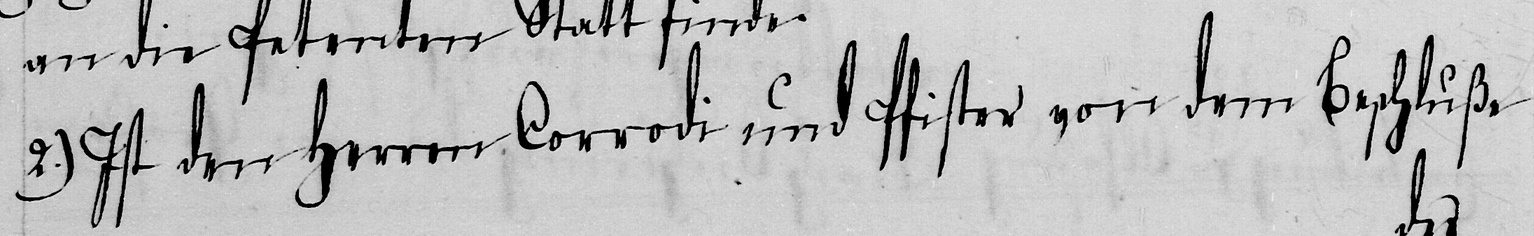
2.) Ist den Herren Corrodi und Pfister von dem Beschluße
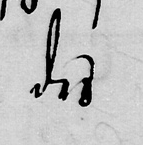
diese
